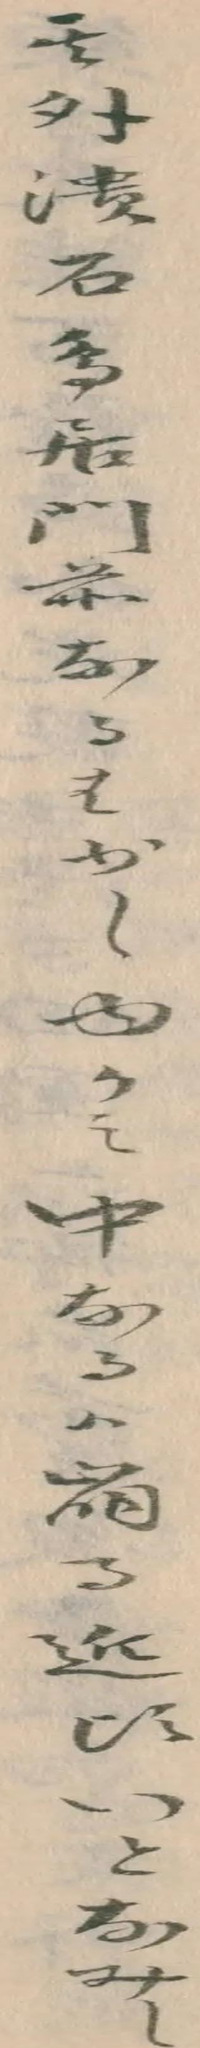其外潰石鳥居門前なるは少しゆかみ中なるは崩る近頃いとなみし
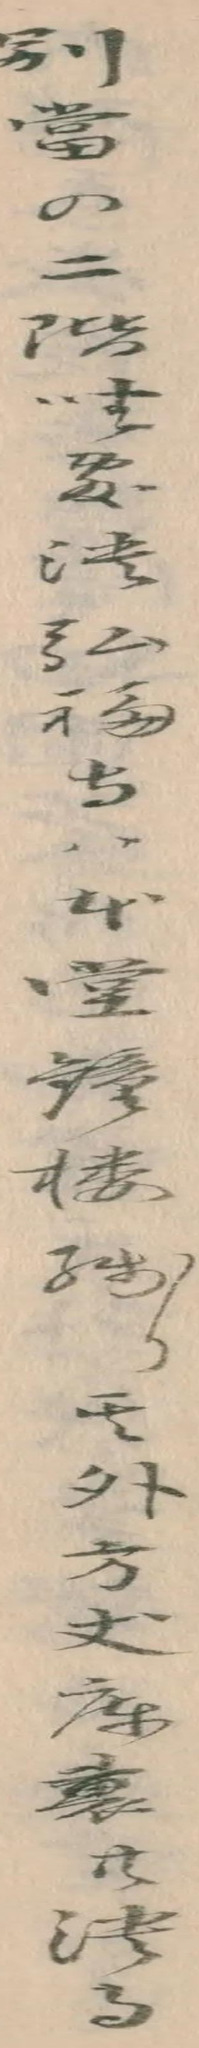別当の二階坐敷潰弘福寺は本堂鐘楼残り其外方丈庫裏共潰る
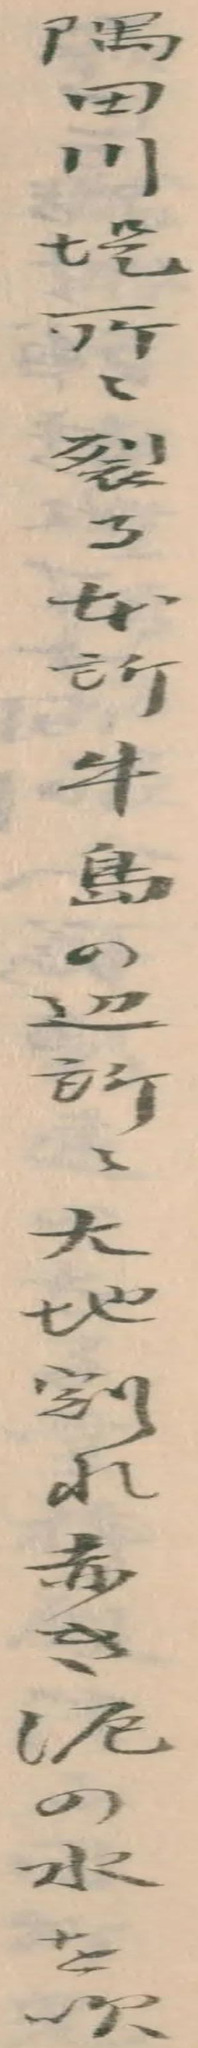隅田川堤所々裂る本所牛島の辺所々大地割れ赤き泥の水を吹
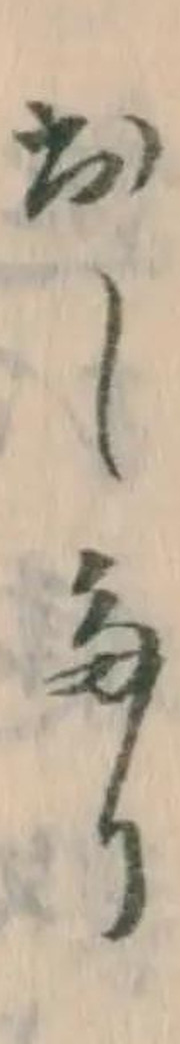出したり
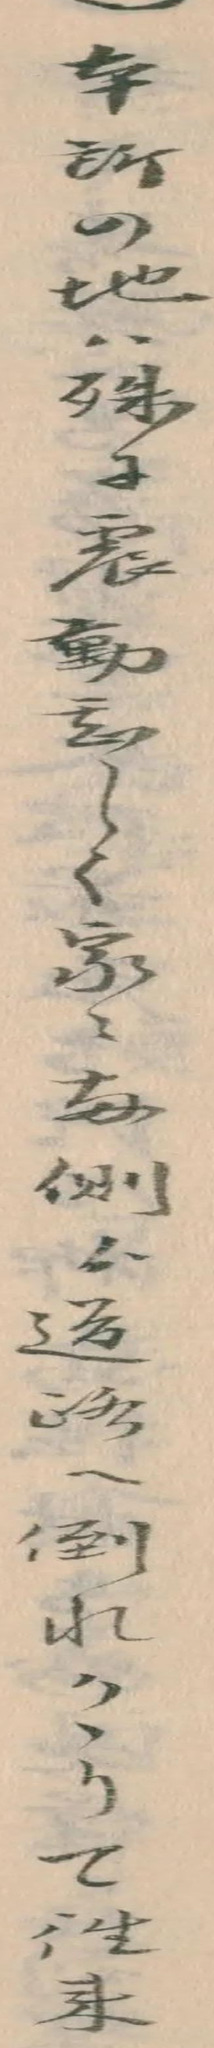〇本所の地は殊に震動甚しく家々両側より道路へ倒れかゝりて往来
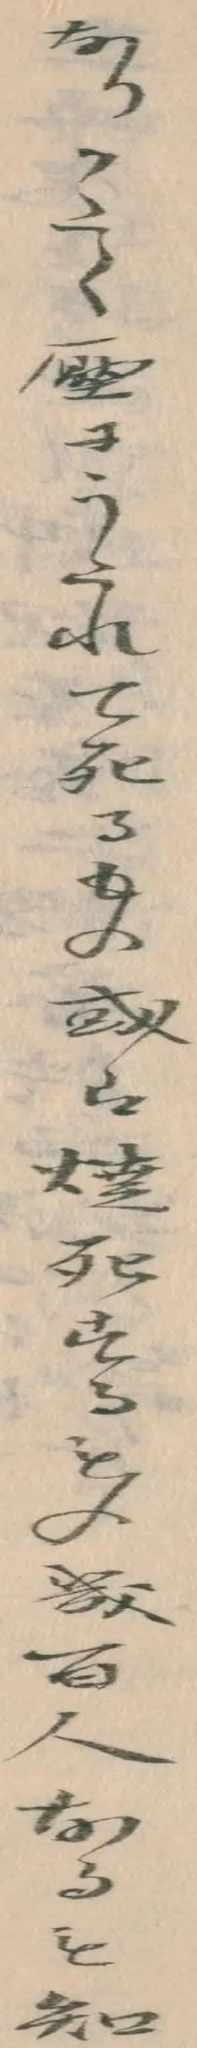なりかたく壓にうたれて死るもの或は焼死するもの幾百人なるも知
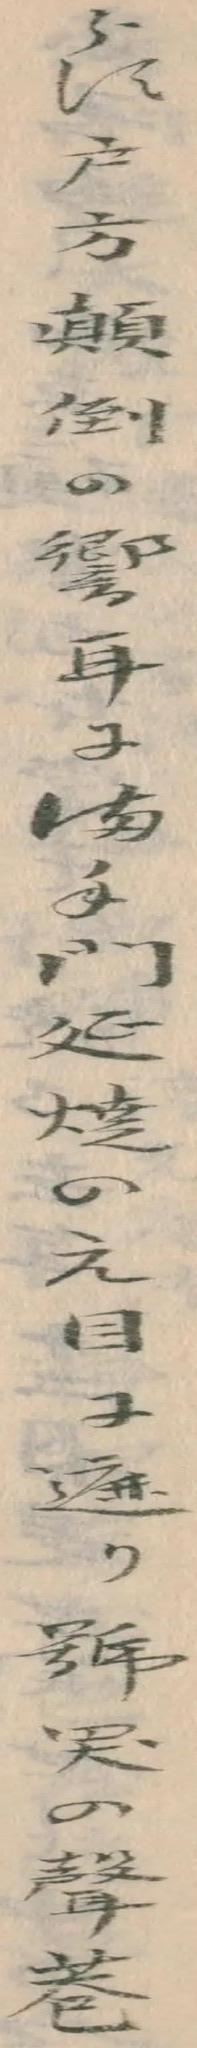らす戸方顛倒の響耳に満て門延焼の元目に遮り号哭の声巷
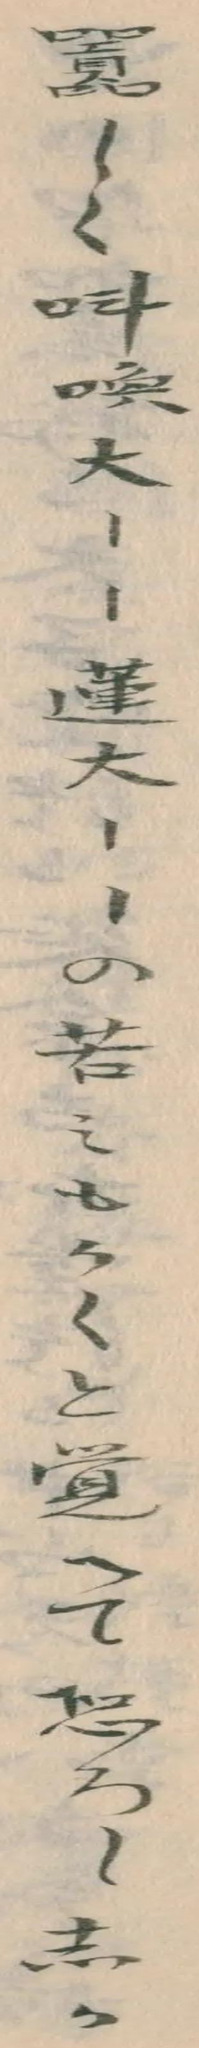囂しく叫喚大－－蓮大－－の苦みもかくと覚へて恐ろししか
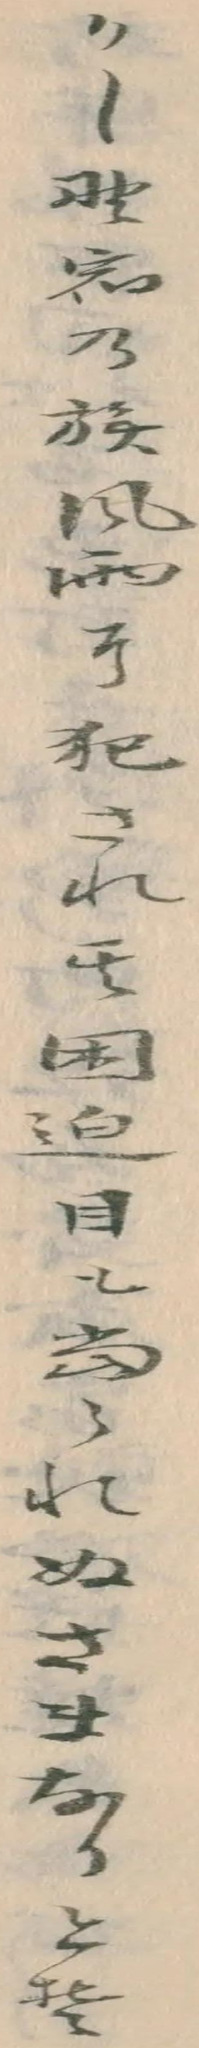りし野宿の族風雨に犯され其困迫目も当られぬさまなりとそ
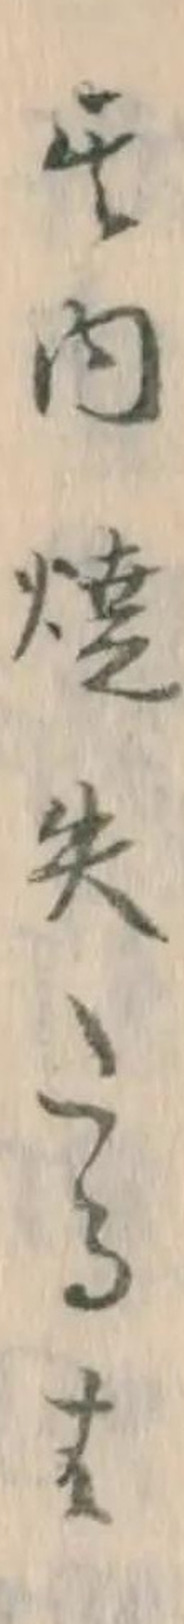其内焼失たるは

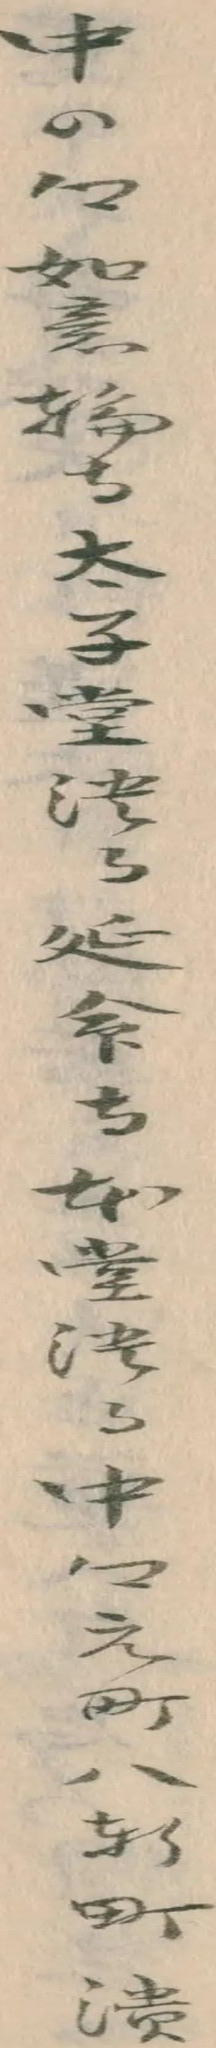中の郷如意輪寺太子堂潰る延命寺本堂潰る中郷元町ハ軒町潰
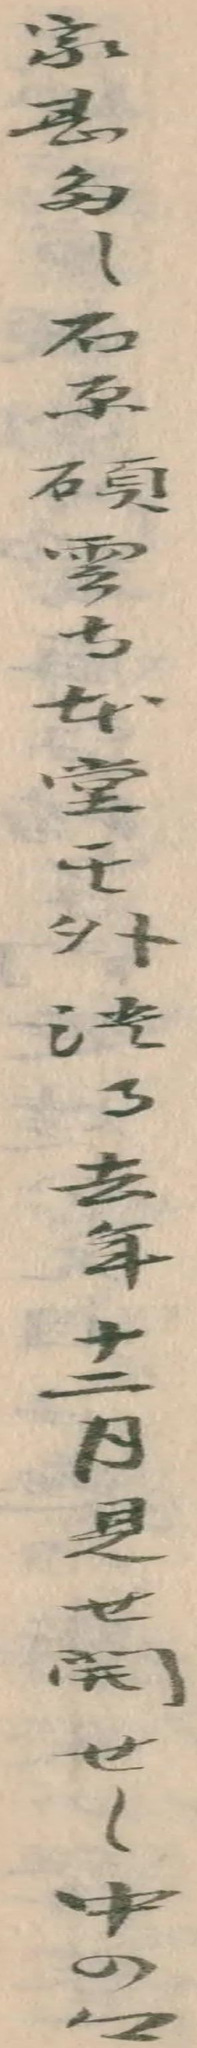家甚多し石原碩雲寺本堂其外潰る去年十二月見せ開せし中の郷
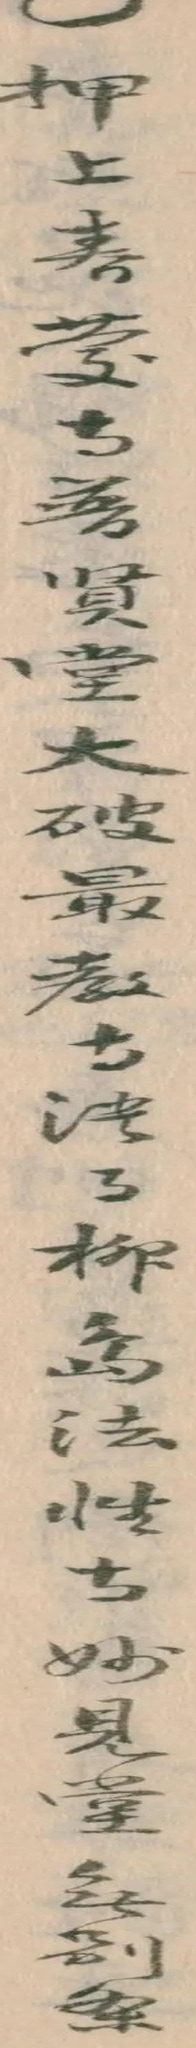〇押上春慶寺普賢堂大破最教寺潰る柳島法性寺妙見堂無別条
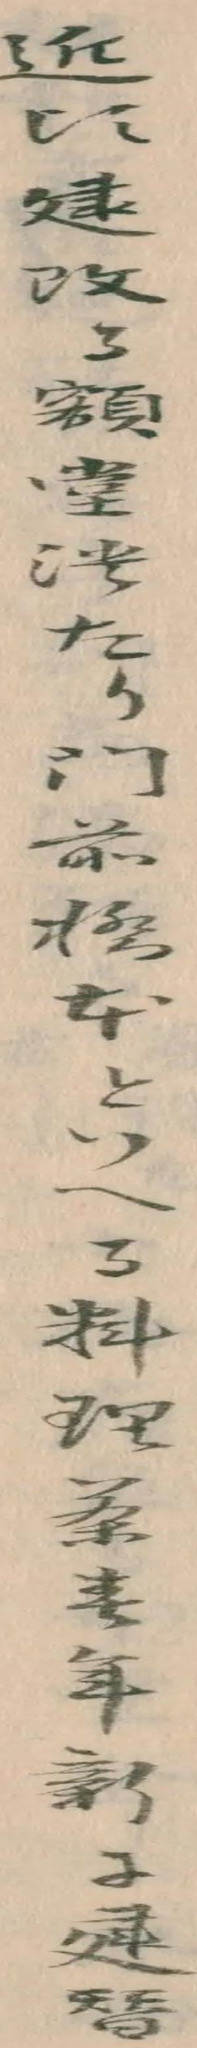近頃建改る額堂潰たり門前橋本といへる料理茶春年新に建替
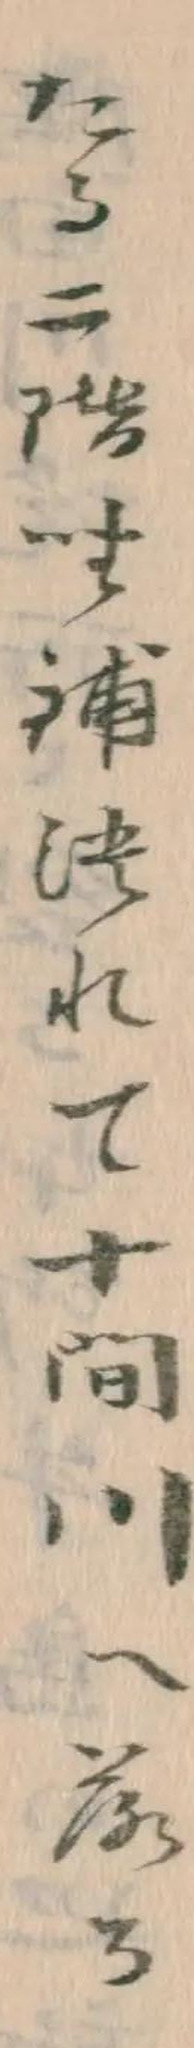たる二階坐鋪潰れて十間川へ落る
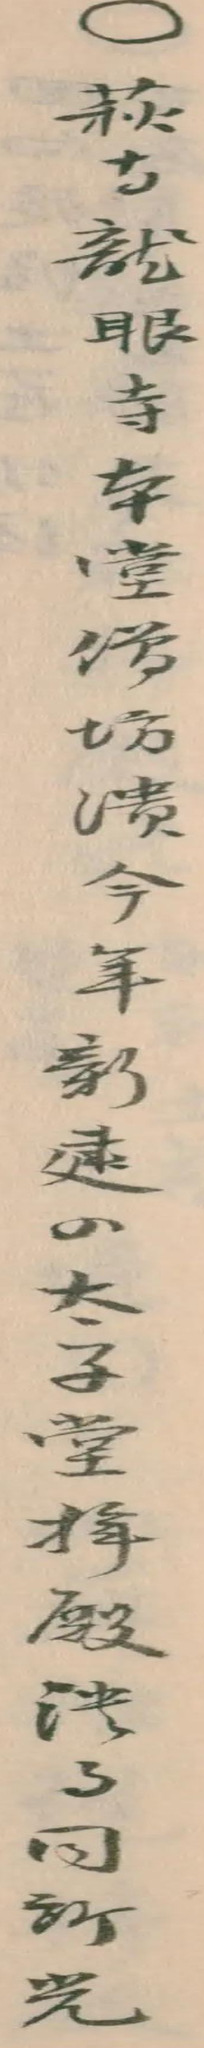〇萩寺龍眼寺本堂僧坊潰今年新建の太子堂拝殿潰る同所光
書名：地災撮要. 巻7-9(地震之部)
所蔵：国立国会図書館 National Diet Library, JAPAN
